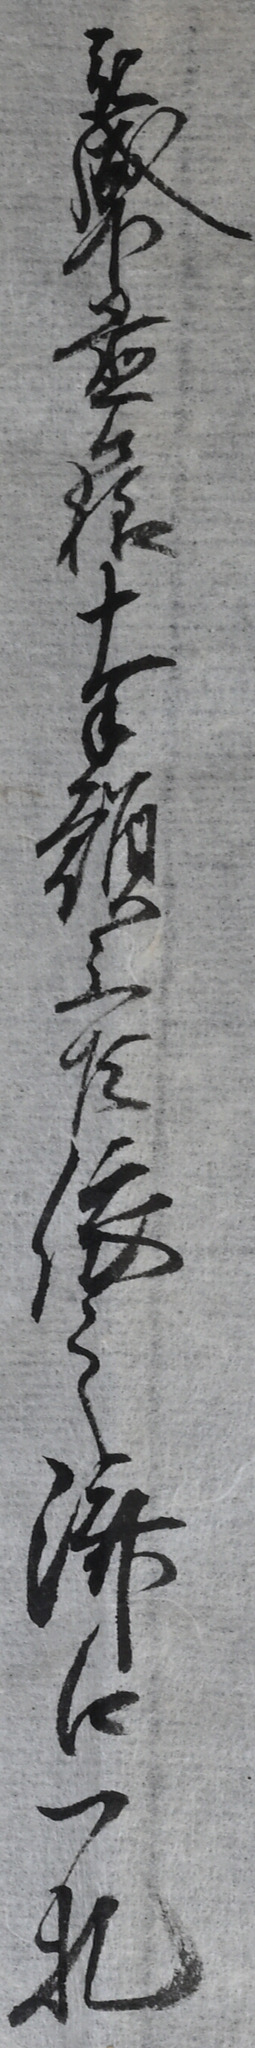被成下置候様奉願上候依之済口一札
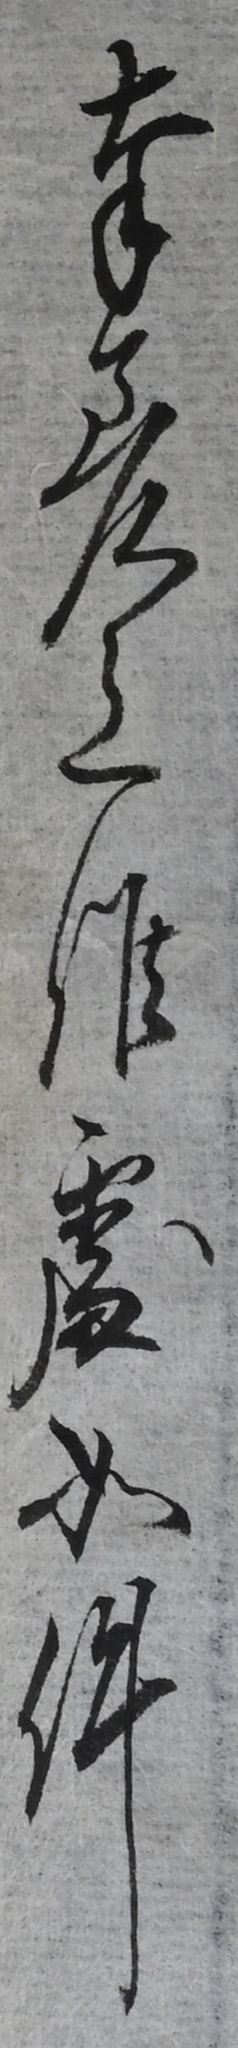奉差上候処如件
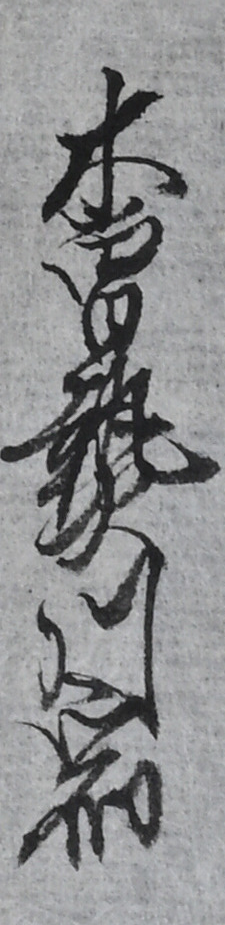木曽贄川宿
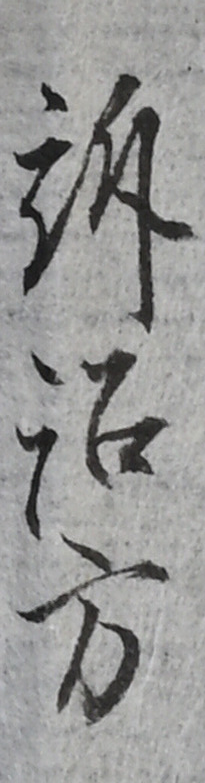訴治方
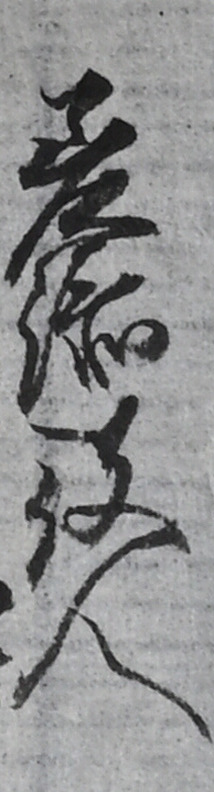差添役人
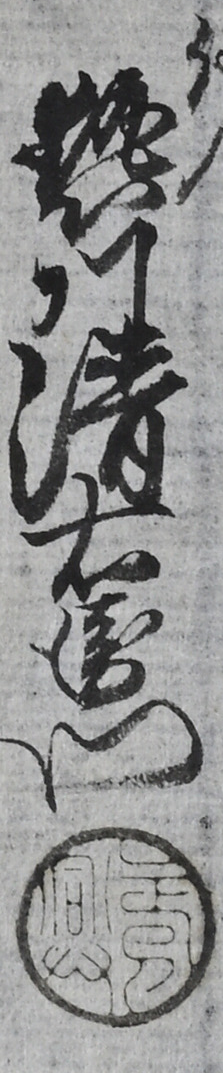贄川清右衛門㊞
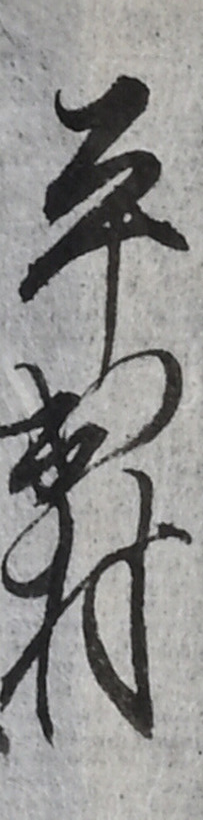平出村
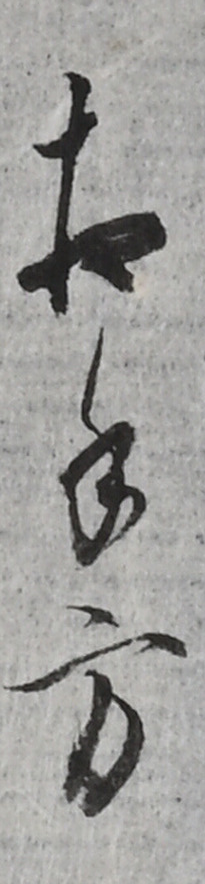相手方
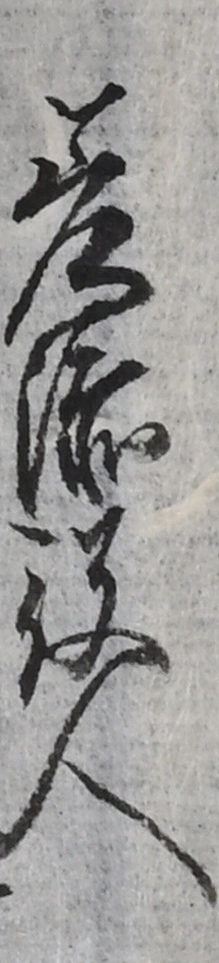差添役人
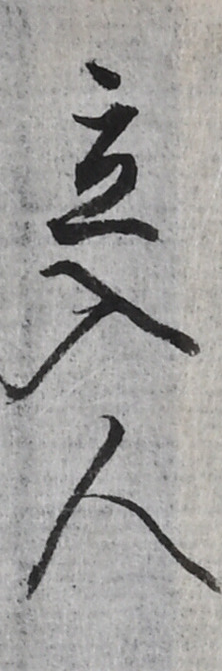立入人
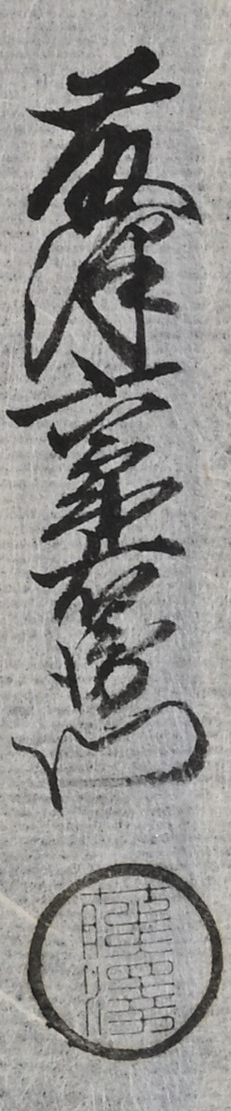藤沢六郎右衛門㊞
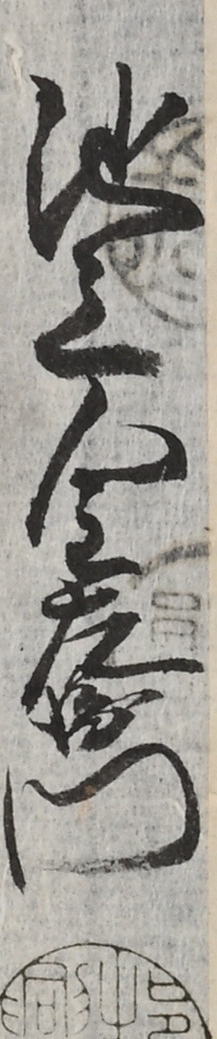池上金左衛門㊞
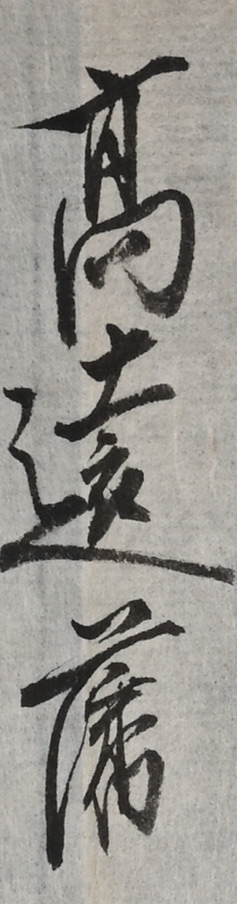高遠藩
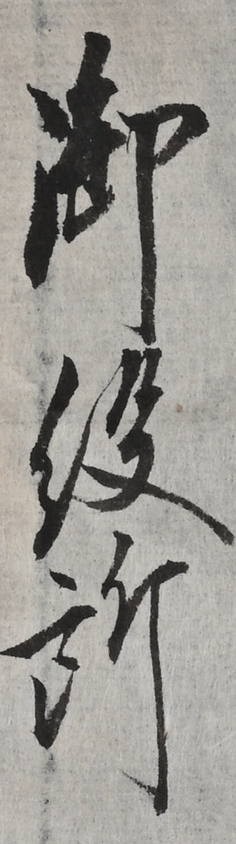御役所
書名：差上申済口一札之事
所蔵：伊那市立高遠町図書館・合同会社AMANE
